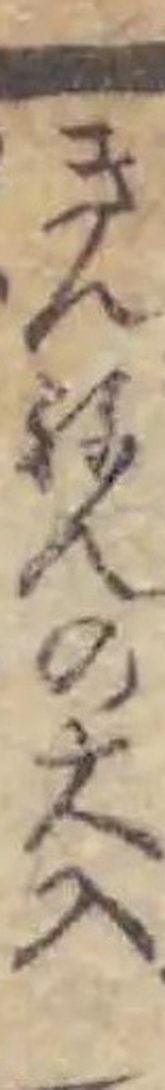きんねんの大入
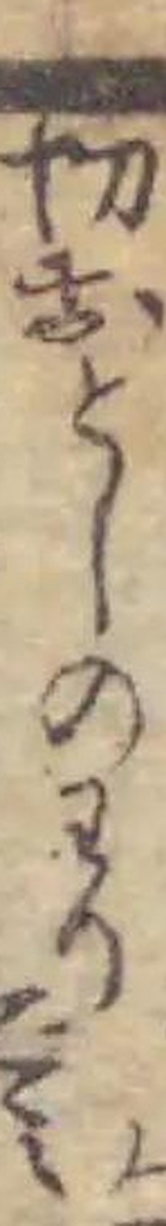切おとしのわりこミ
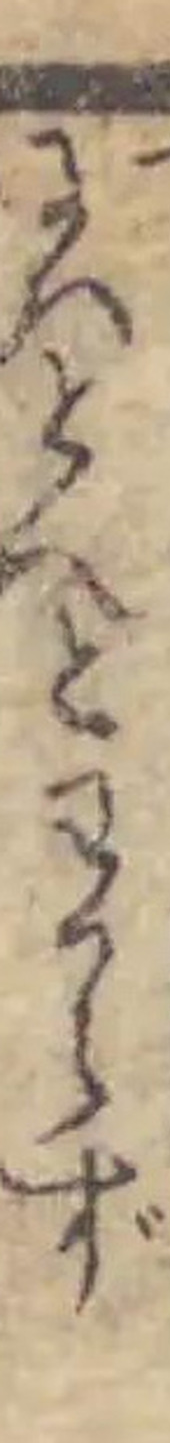にハとんとわからず
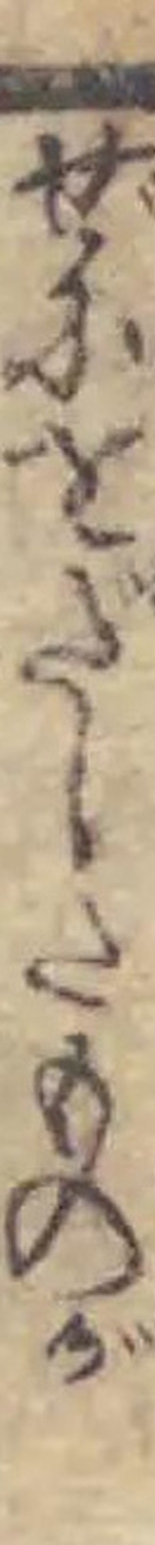ぜにをだしたものが
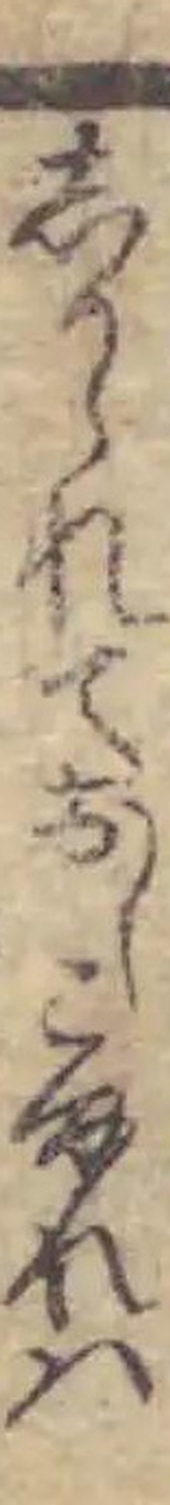しからておしこまれハ
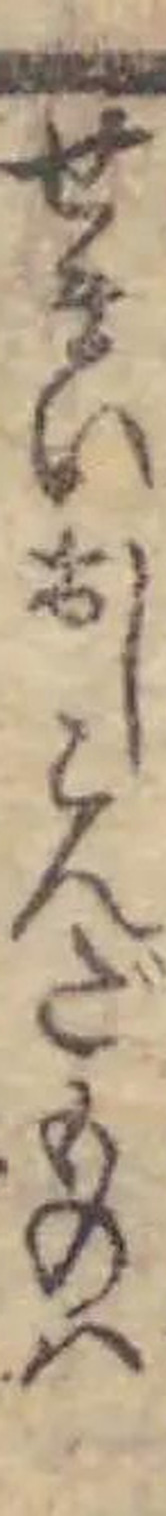せまいおしこんだものハ
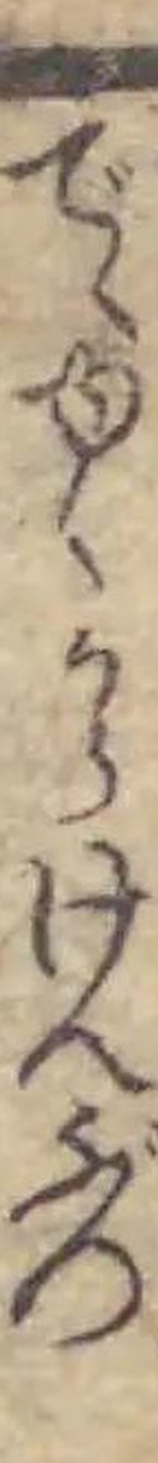でゝゆくからけんぶつ
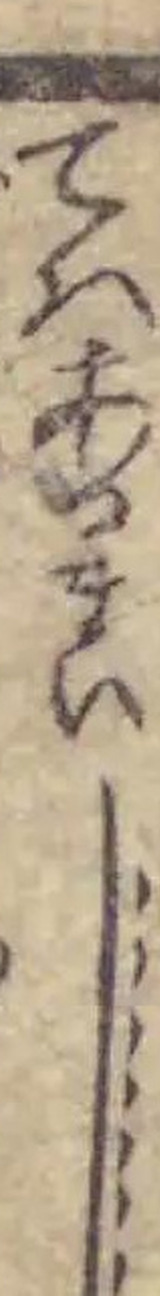てハあるまい
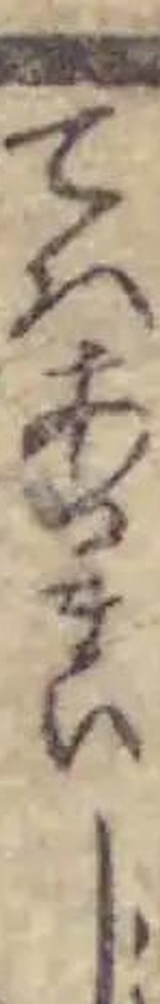てハあるまい
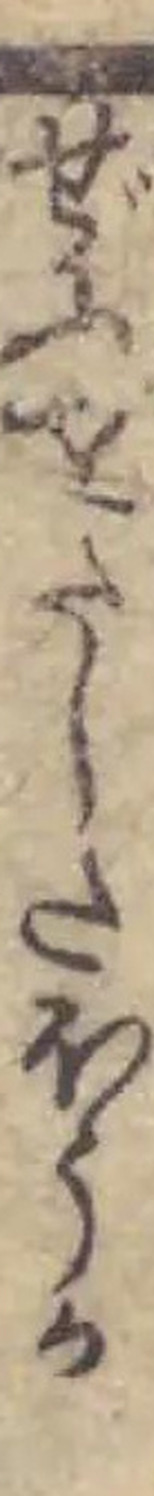ぜにをたしたほうが
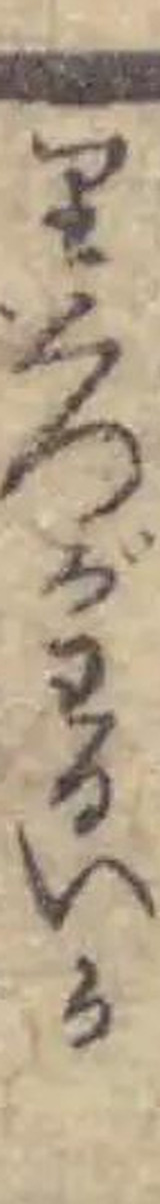りくつがわるいか
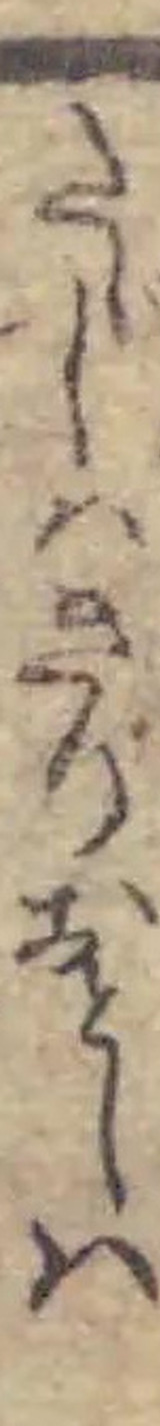たゞしきハきりおとしハ
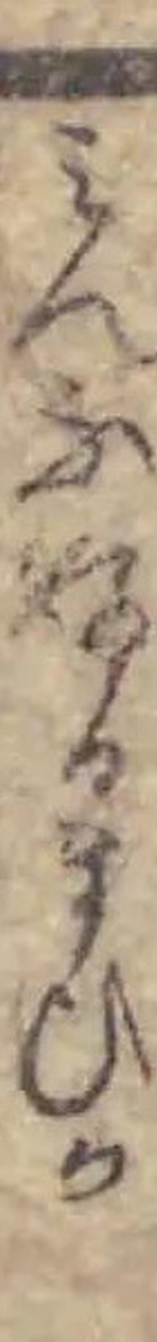ミんなふるまいか
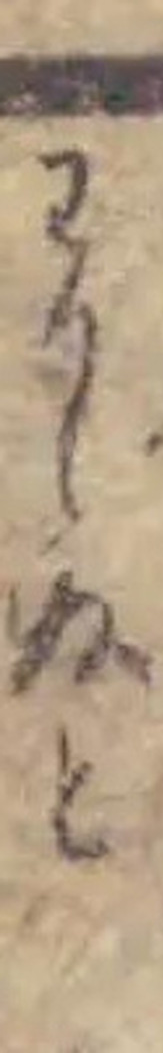わからぬと
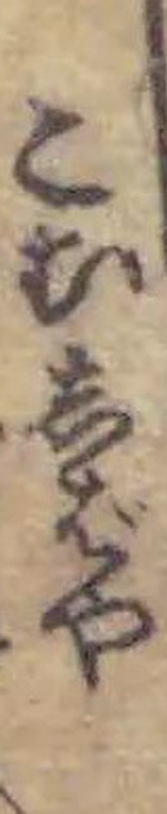こむしばや
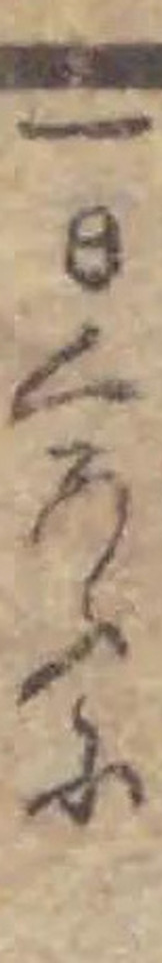一日くろふに
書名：豆男江戸見物 2巻
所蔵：国立国会図書館 National Diet Library, JAPAN
